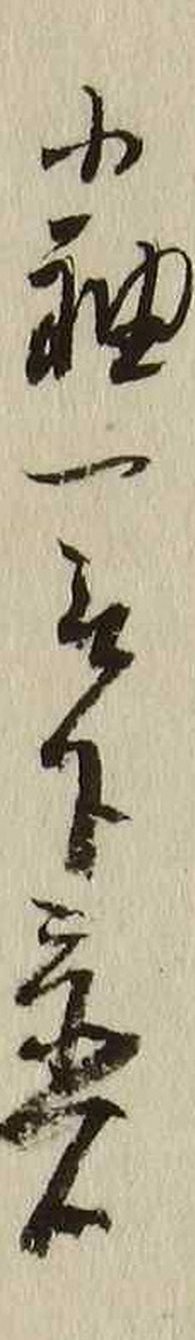小袖一被下置候
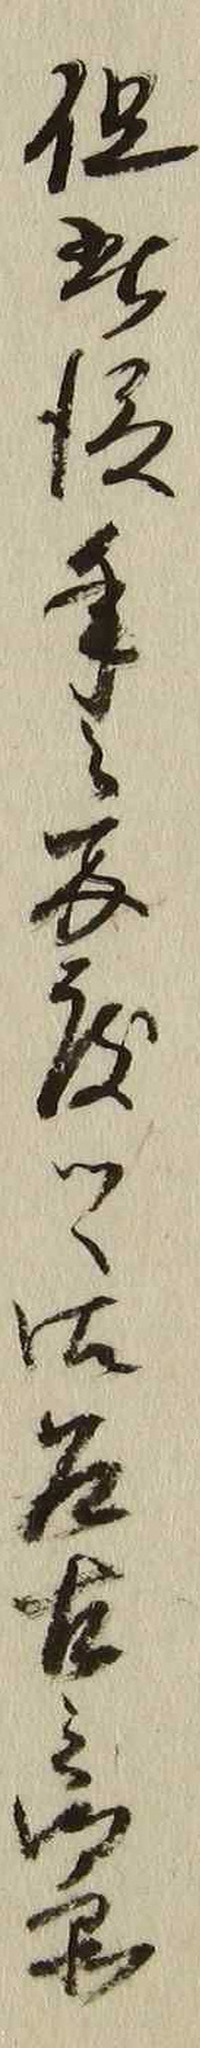但此後年々両度ツヽ御召古之御品
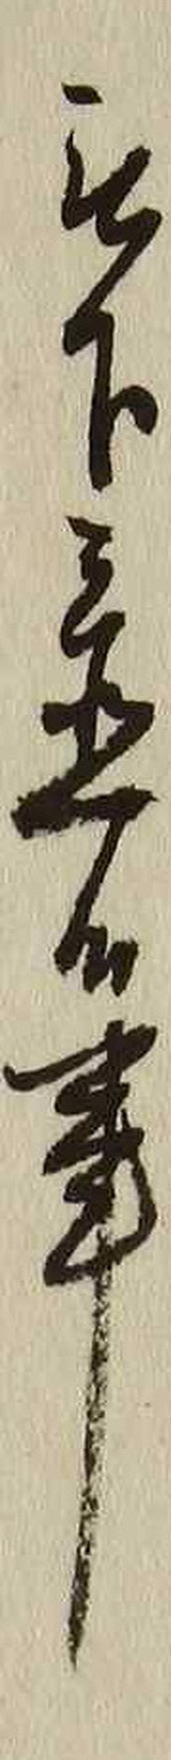被下置候事
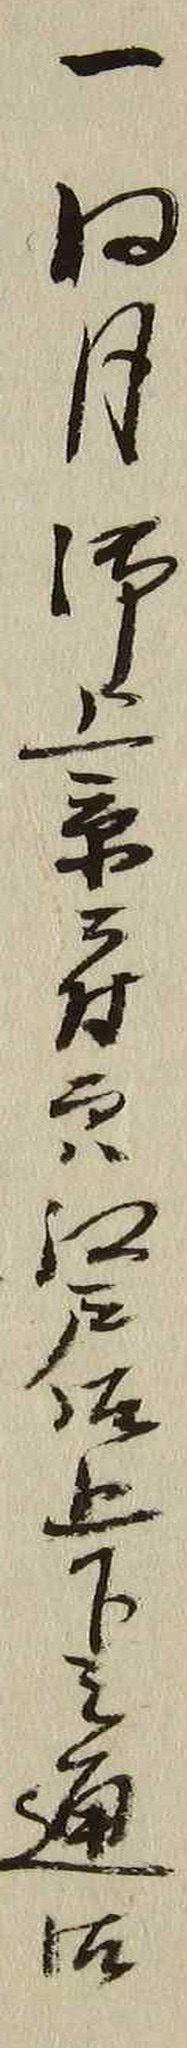一同月御上京ニ付而ハ江戸御上下之通御
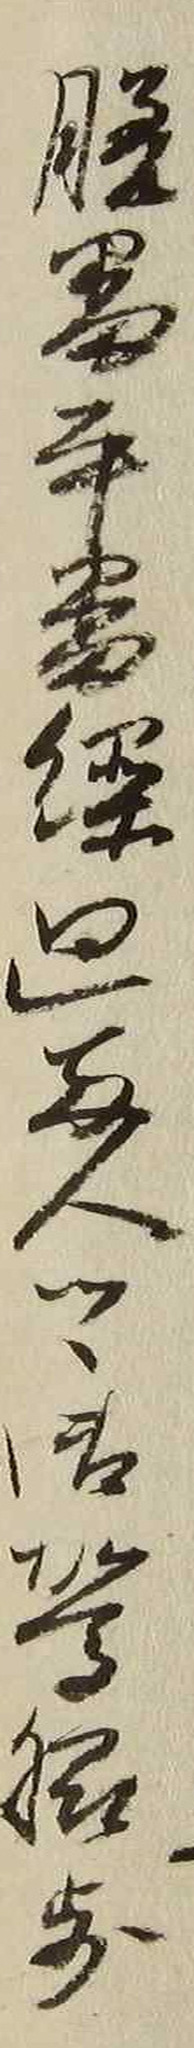膳番平番繰廻両人ツヽ御駕脇歩
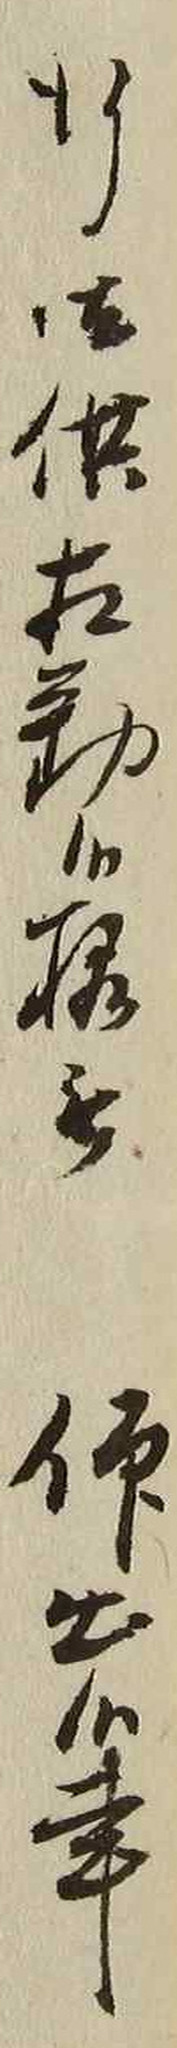行御供相勤候様被仰出候事
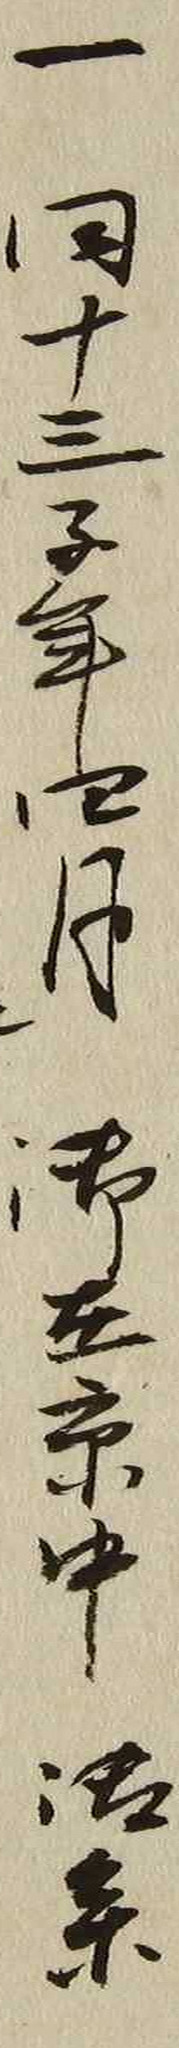一同十三子年四月御在京中御参
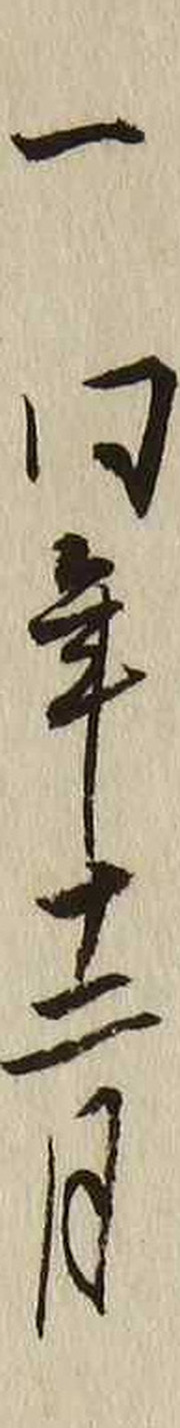一同年十二月
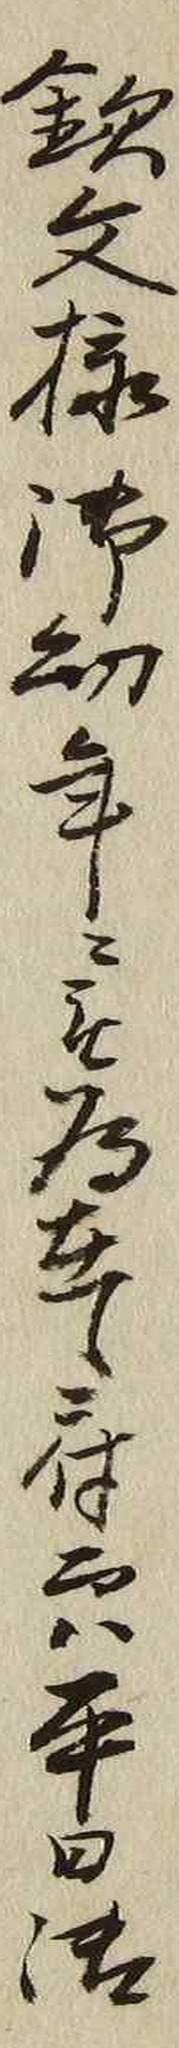欽文様御幼年ニ被為在候ニ付而ハ平日御
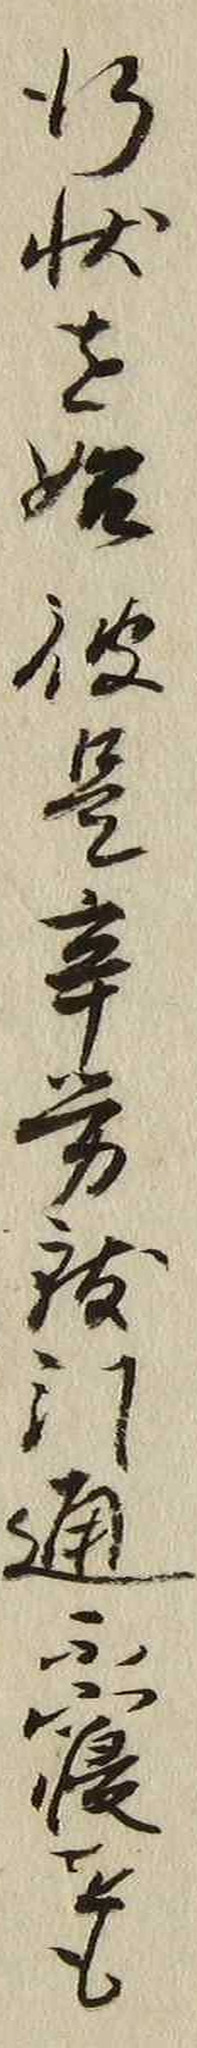行状を始彼是辛労致引通不寝をも
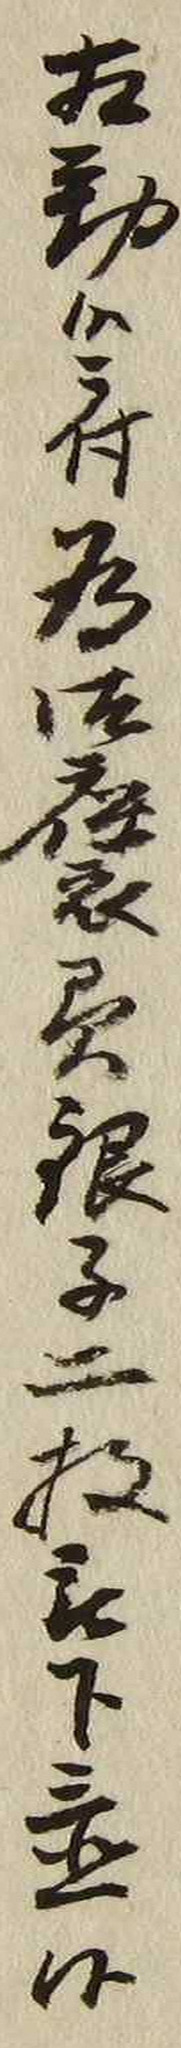相勤候ニ付為御褒美銀子二枚被下置候
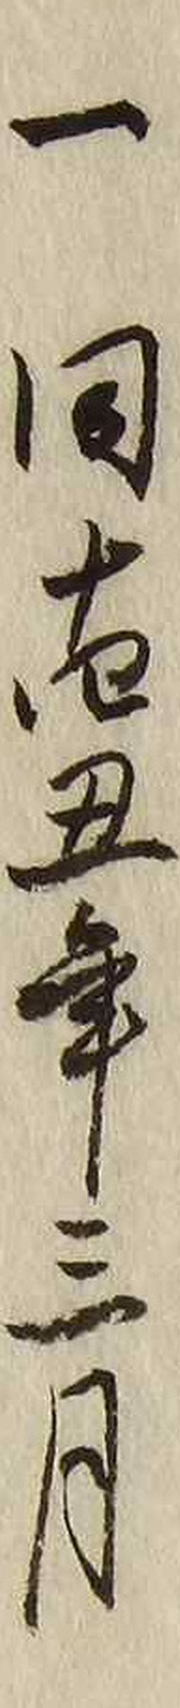一同十四丑年三月
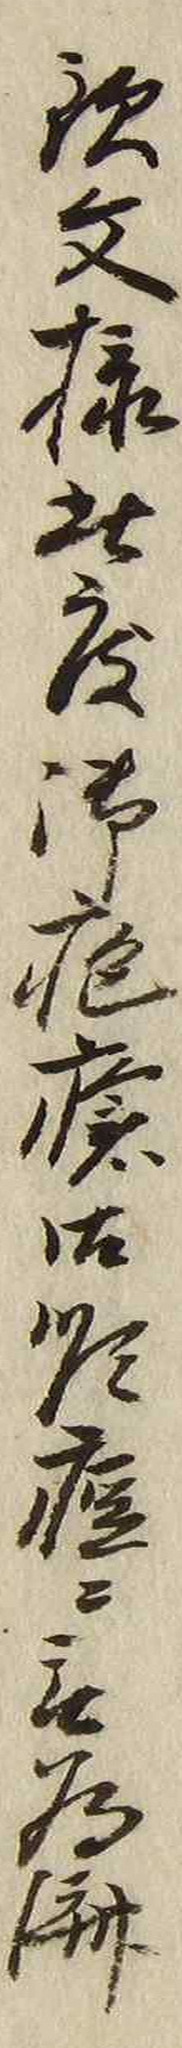欽文様此度御疱瘡御順痘ニ被為済

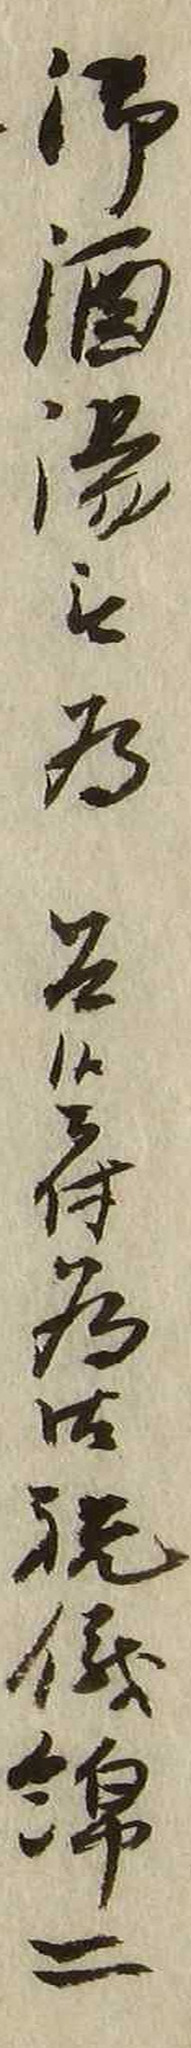御酒湯被為召候ニ付為御祝儀綿二
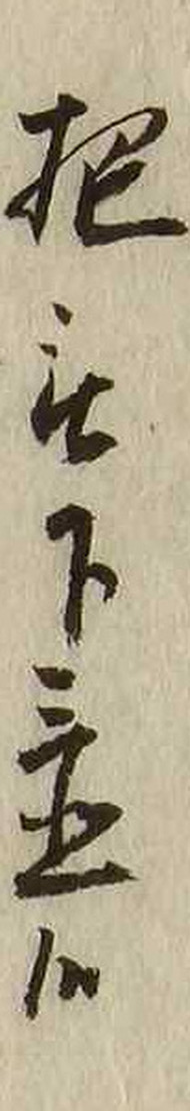把被下置候
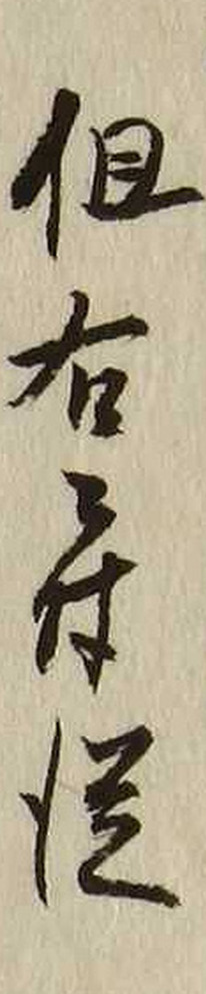但右ニ付従
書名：諸士系譜　巻之345　も之部1
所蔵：会津若松市立会津図書館
